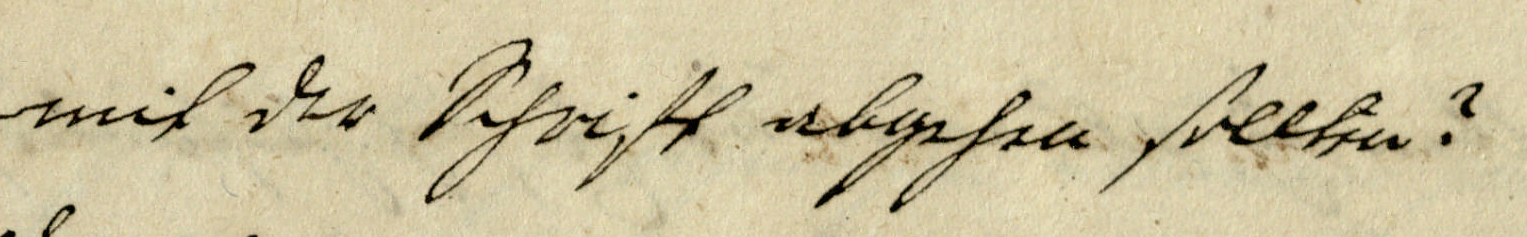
mit der Schrift abgehen sollten?
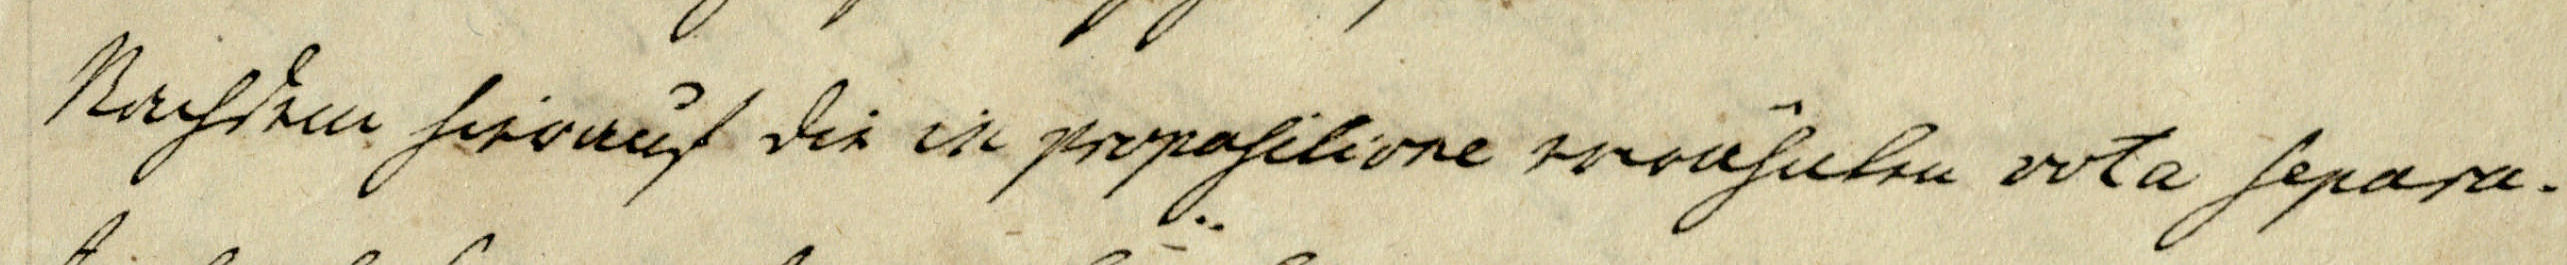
Nachdem hierauf die in propositione erwähnten vota separa¬
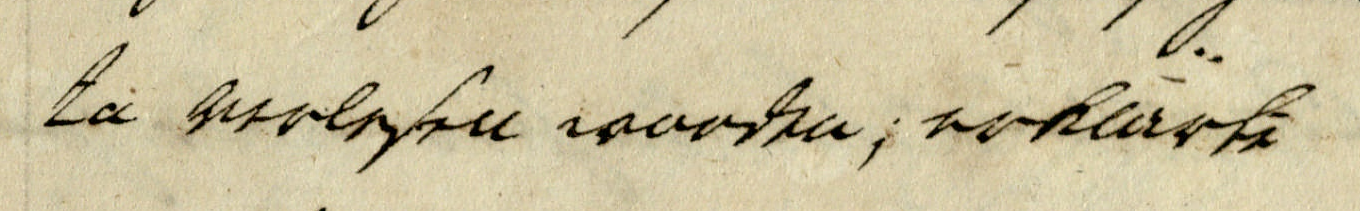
ta verlesen worden, erklärte
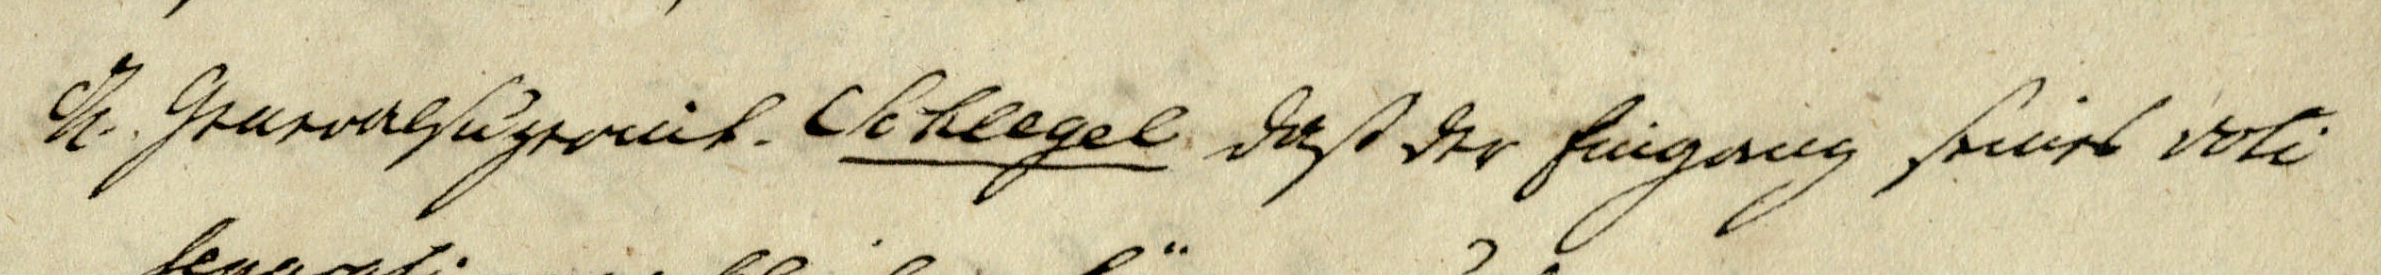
dh. Generalsuperint. Schlegel daß der Eingang seines voti
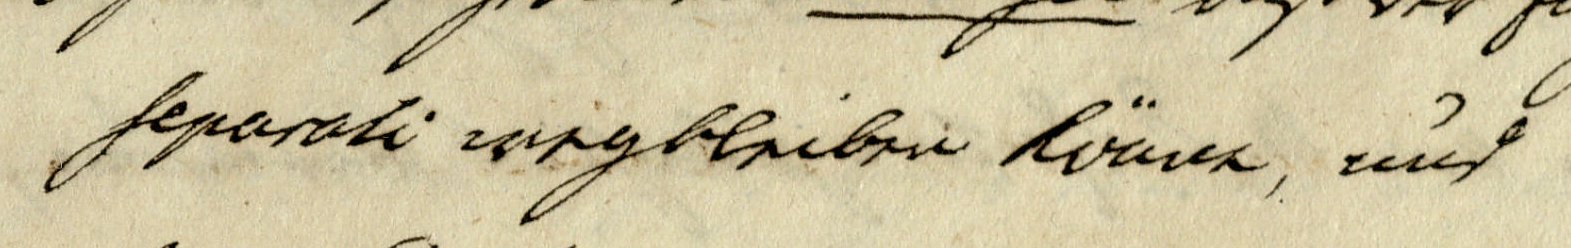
separati wegbleiben könne, und
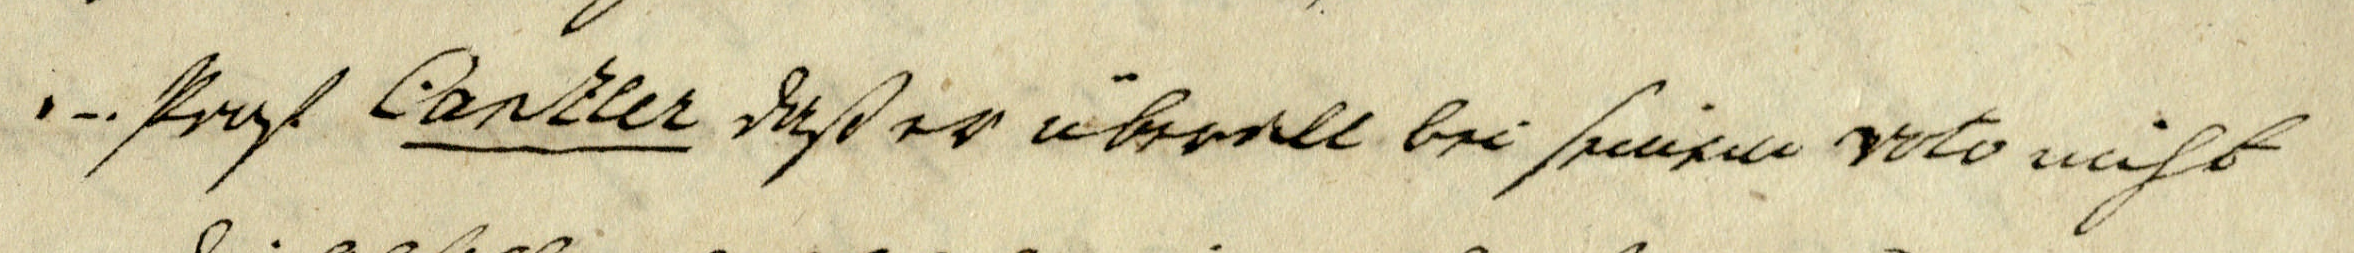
Prof Canzler daß er überall bei seinem voto nicht
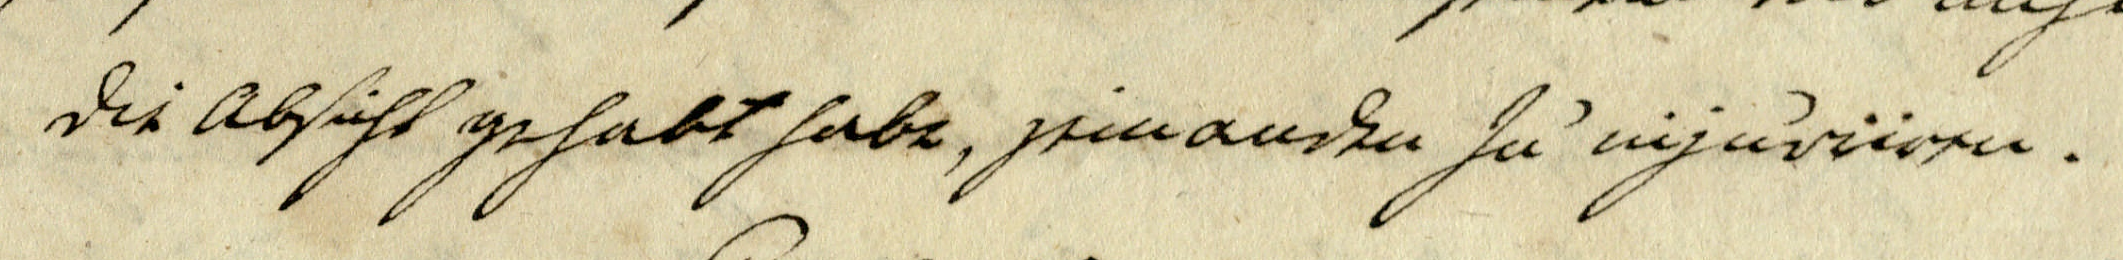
die Absicht gehabt habe, jemanden zu injuriiren.
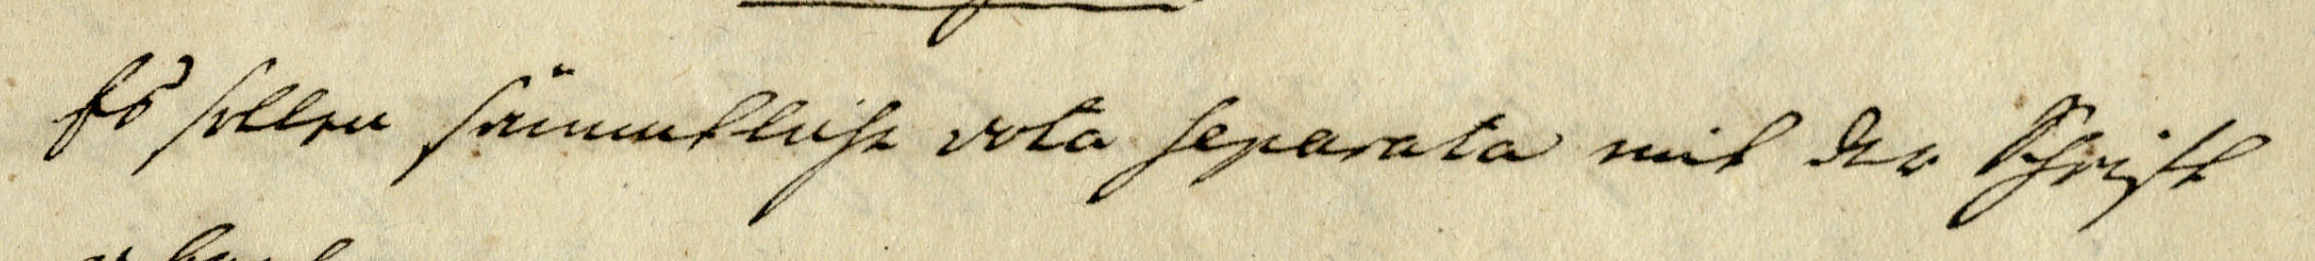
Es sollen sämmtliche vota separata mit der Schrift
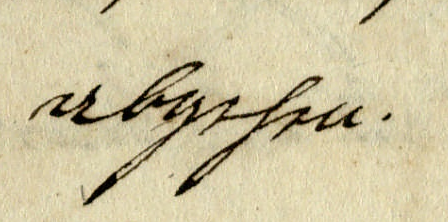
abgehen.
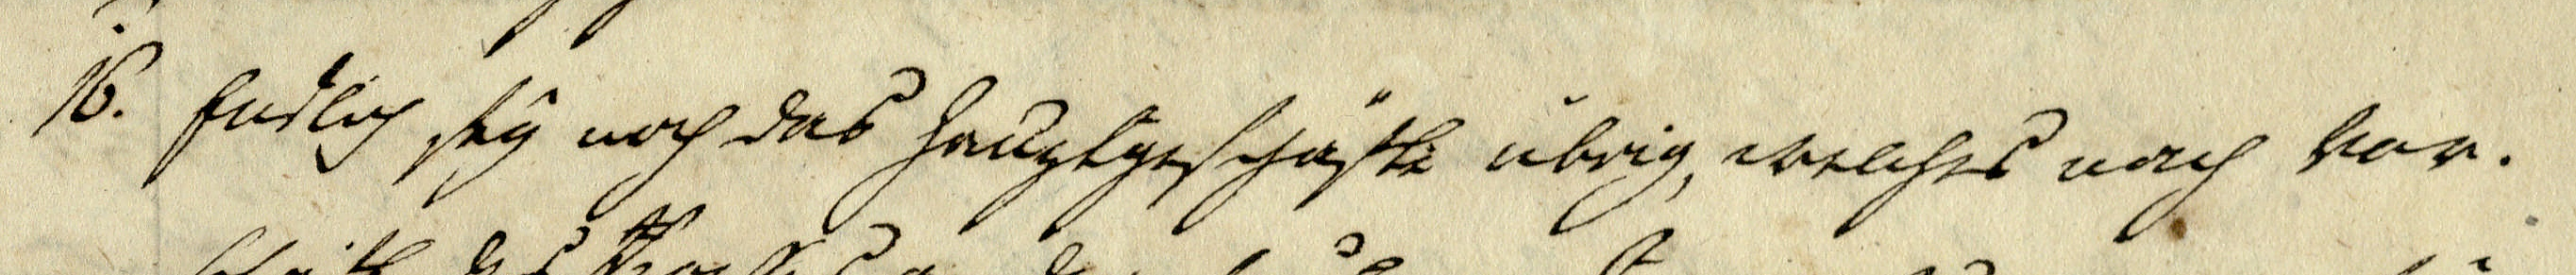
16. Endlich seÿ noch das Hauptgeschäfte übrig, welches nach Vor¬
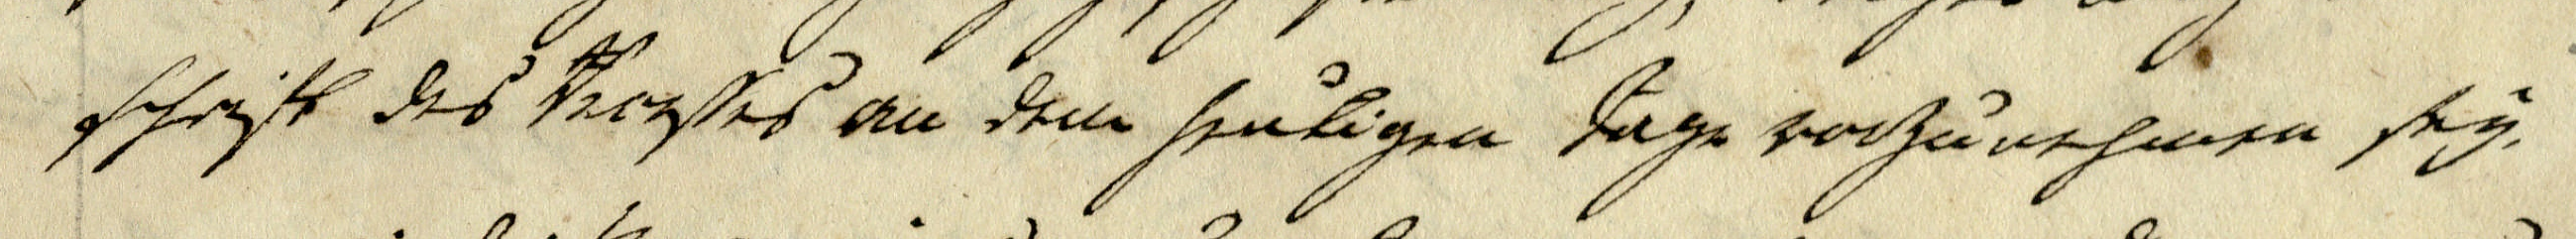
schrift der Recesses an dem heutigen Tage vorzunehmen seÿ,
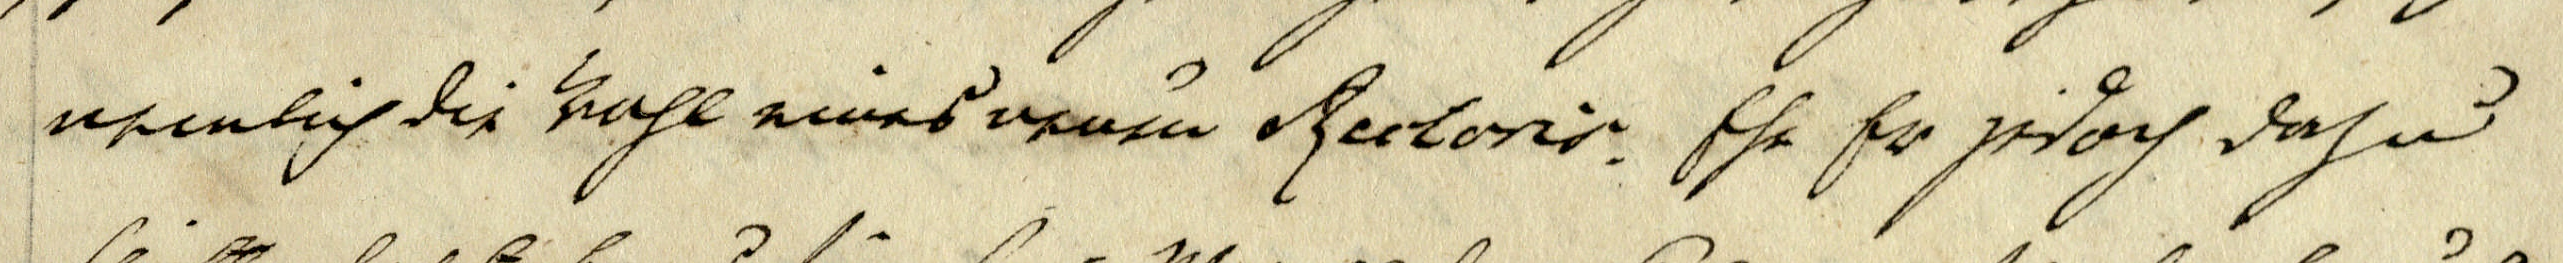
nemlich die Wahl eines neuen Rectoris. Ehe Er jedoch dazu
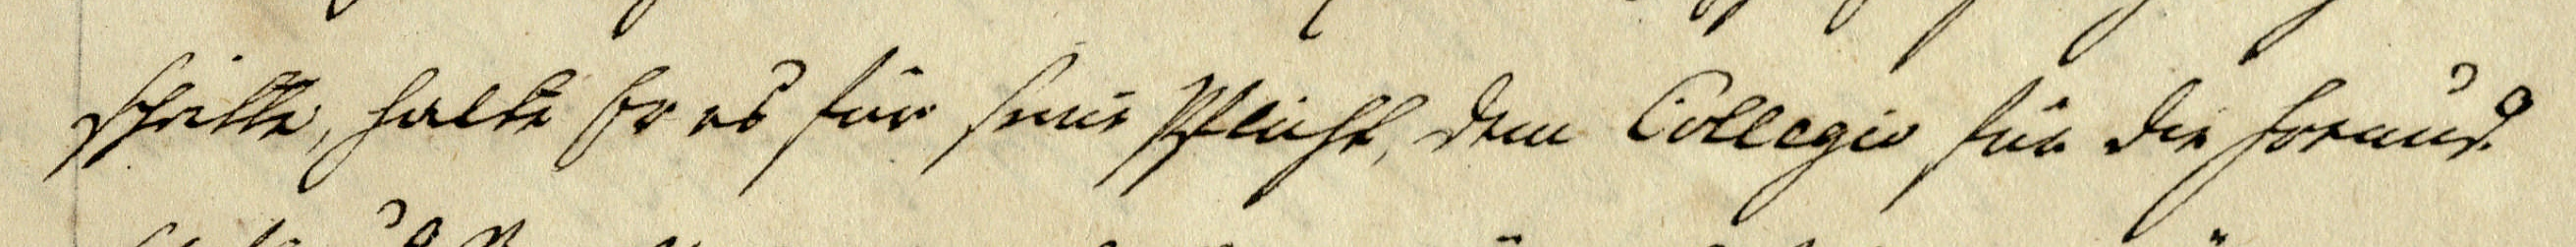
schritte, halte Er es für seine Pflicht, dem Collegio für die Freund¬
